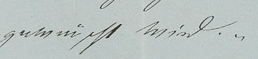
gewünscht wird.
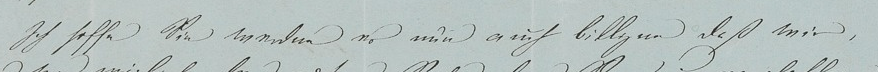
Ich hoffe Sie werden es nun auch billigen daß wir,
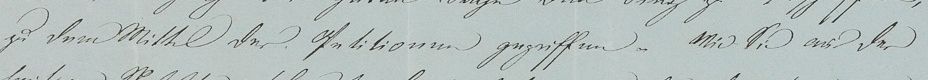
zu dem Mittel der Petitionen gegriffen. Wie Sie aus der
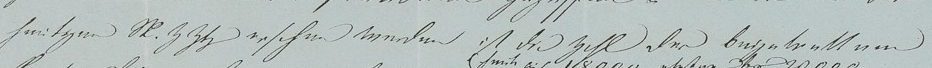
heutigen N. Z. Ztg. ersehen werden ist die Zahl der beigetrettnen
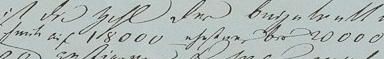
bereits über 17000 heute auf 18000
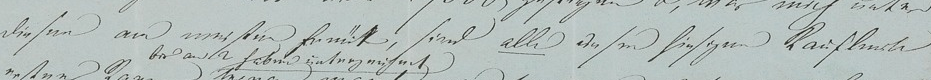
diesen am meisten freüt, sind alle unsre hiesigen Kaufleute
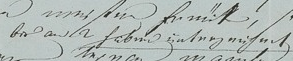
bis an 2 haben unterzeichnet
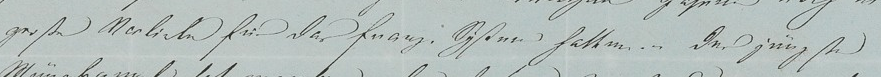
große Vorliebe für das franz. System hatten. Der jüngste
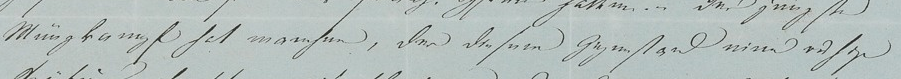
Münzkampf hat manchen, der diesem Gegenstand eine ruhige
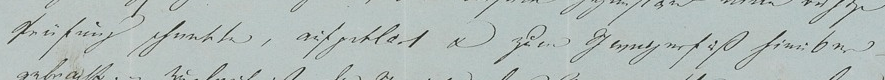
Prüfung schenkte, aufgeklärt & zum Schweizerfuß hinüber-
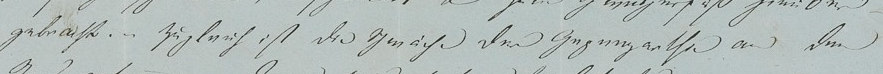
gebracht. Zugleich ist die Schwäche der Gegnerparthei an den
